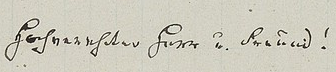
Hochverehrter Herr u. Freund!
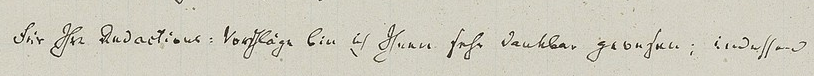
Für Ihre Redactions-Vorschläge bin ich Ihnen sehr dankbar gewesen; indessen
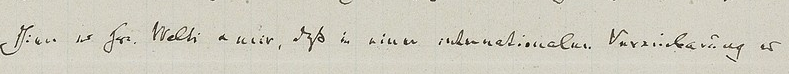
schien es Hrn. Welti & mir, daß in einer internationalen Vereinbarung es
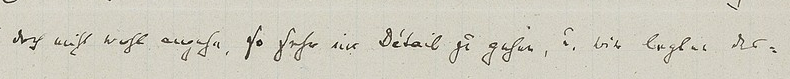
doch nicht wohl angehe, so sehr ins Détail zu gehen, u. wir legten des-
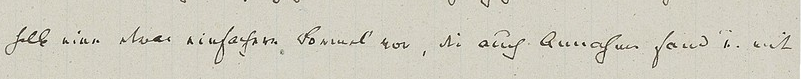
halb eine etwas einfachere Formel vor, die auch Annahme fand u. mit
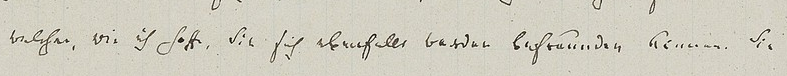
welcher, wie ich hoffe, Sie sich ebenfalls werden befreunden können. Sie
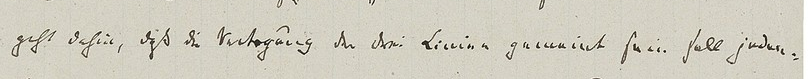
geht dahin, daß die Vertagung der drei Linien gemeint sein soll jeden-
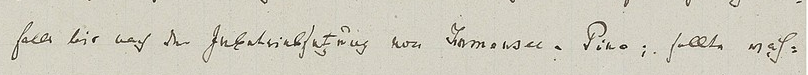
falls bis nach der Inbetriebsetzung von Immensee–Pino ; sollte wäh-
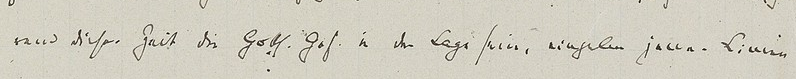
rend dieser Zeit die Gotth. Ges. in der Lage sein, einzelne jener Linien
